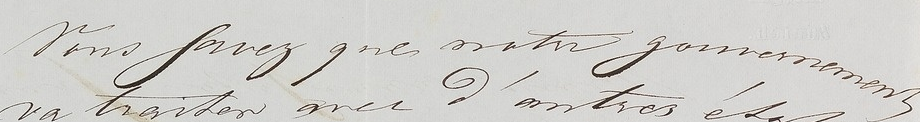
Vous savez que notre gouvernement
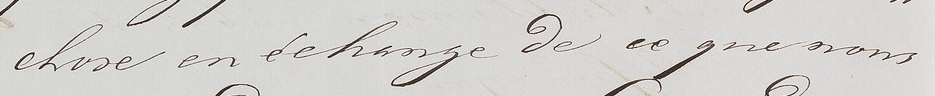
chose en échange de ce que nous
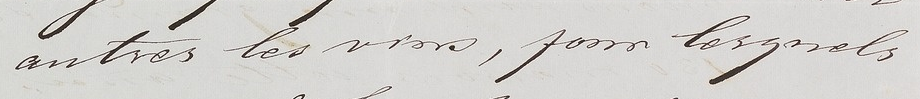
autres les vins, pour lesquels
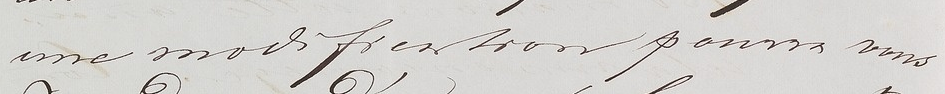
une modification pourra vous
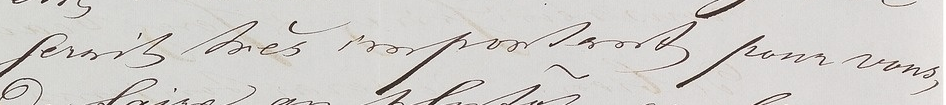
serait très important pour vous,
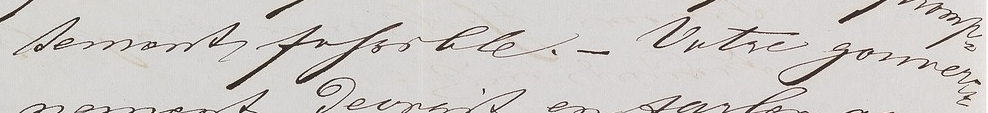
tement possible. – Votre gouver-
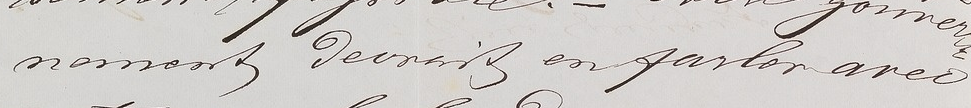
nement devrait en parler avec
